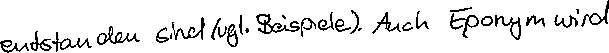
entstanden sind (vgl. Beispiele). Auch Eponym wird
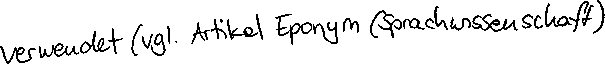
verwendet (vgl. Artikel Eponym (Sprachwissenschaft)
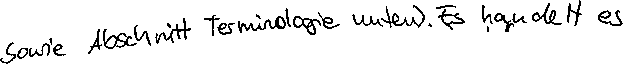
sowie Abschnitt Terminologie unten). Es handelt es
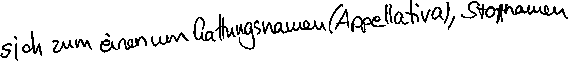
sich zum einen um Gattungsnamen (Appellativa), Stoffnamen
